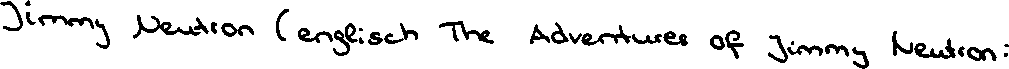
Jimmy Neutron (englisch The Adventures of Jimmy Neutron:
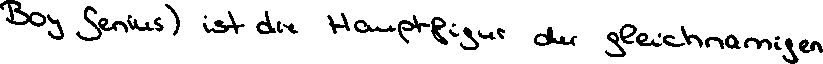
Boy Genius) ist die Hauptfigur der gleichnamigen
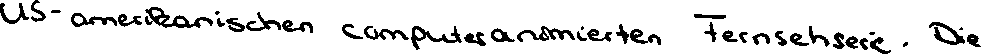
US-amerikanischen computeranimierten Fernsehserie. Die
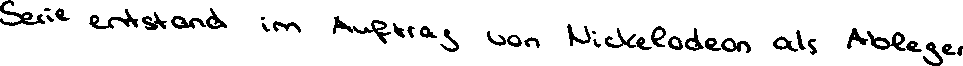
Serie entstand im Auftrag von Nickelodeon als Ableger
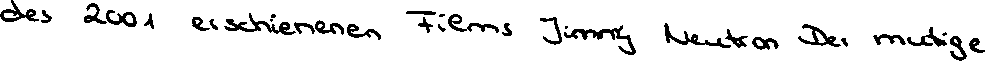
des 2001 erschienenen Films Jimmy Neutron Der mutige
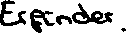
Erfinder.
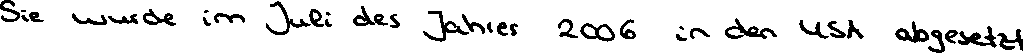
Sie wurde im Juli des Jahres 2006 in den USA abgesetzt.
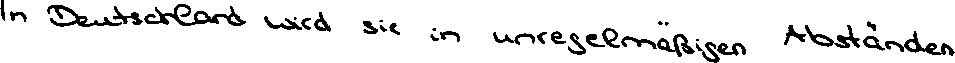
In Deutschland wird sie in unregelmäßigen Abständen
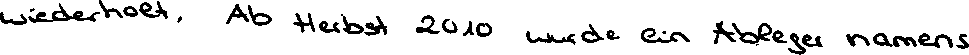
wiederholt. Ab Herbst 2010 wurde ein Ableger namens
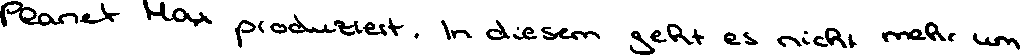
Planet Max produziert. In diesem geht es nicht mehr um
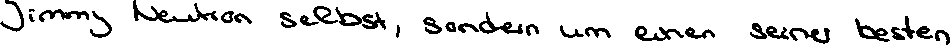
Jimmy Neutron selbst, sondern um einen seiner besten
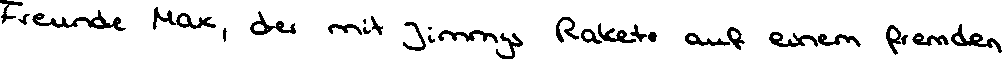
Freunde Max, der mit Jimmys Rakete auf einem fremden
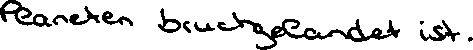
Planeten bruchgelandet ist.
